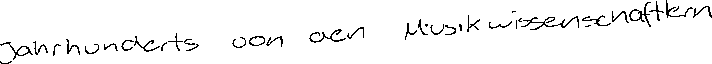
Jahrhunderts von den Musikwissenschaftlern
